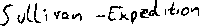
Sullivan-Expedition
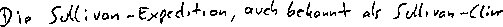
ie Sullivan-Expedition, auch bekannt als Sullivan-Clinton
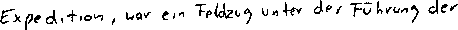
Expedition, war ein Feldzug unter der Führung der
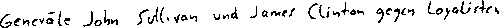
Generäle John Sullivan und James Clinton gegen Loyalisten
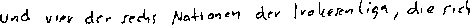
und vier der sechs Nationen der Irokesenliga, die sich
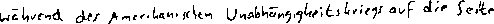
während des Amerikanischen Unabhängigkeitskriegs auf die Seite
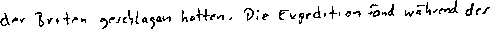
der Briten geschlagen hatten. Die Expedition fand während des
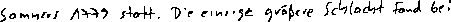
ommers 1779 statt. Die einzige größere Schlacht fand bei
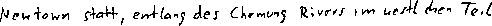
Newtown statt, entlang des Chemung Rivers im westlichen Teil
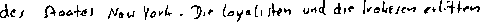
des Staates New York. Die Loyalisten und die Irokesen erlitten
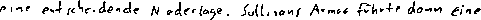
eine entscheidende Niederlage. Sullivans Armee führte dann eine
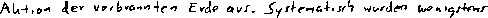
Aktion der verbrannten Erde aus. Systematisch wurden wenigstens
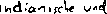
indianische und
